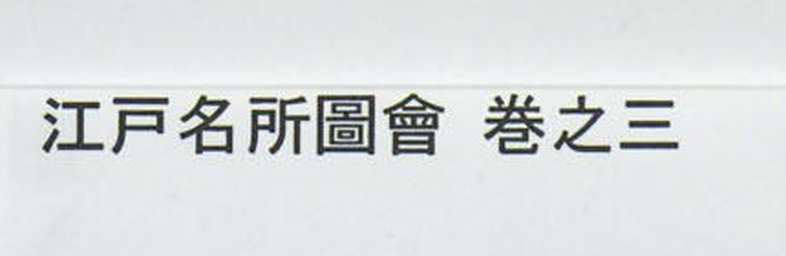江戸名所図會三
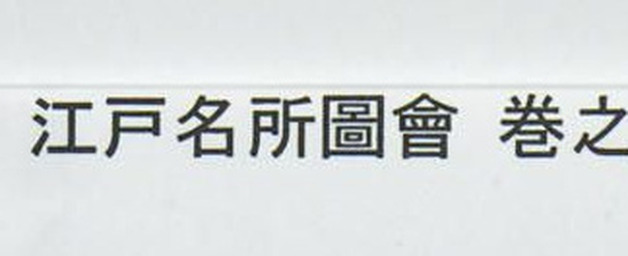江戸名所図會三

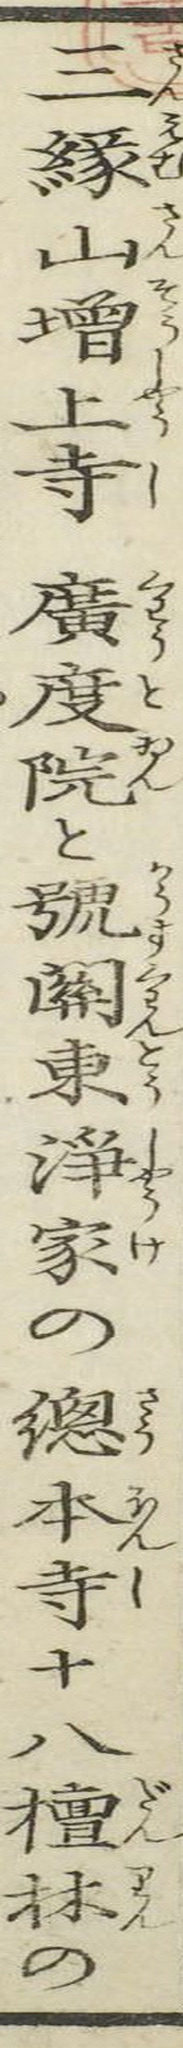三縁山増上寺廣度院と号関東浄家の総本寺十八檀林の
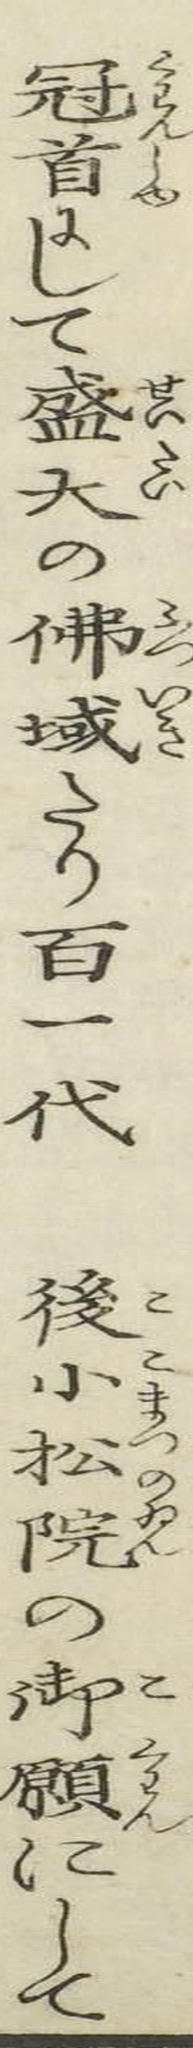冠首にして盛大の佛域たり百一代後小松院の御願にして
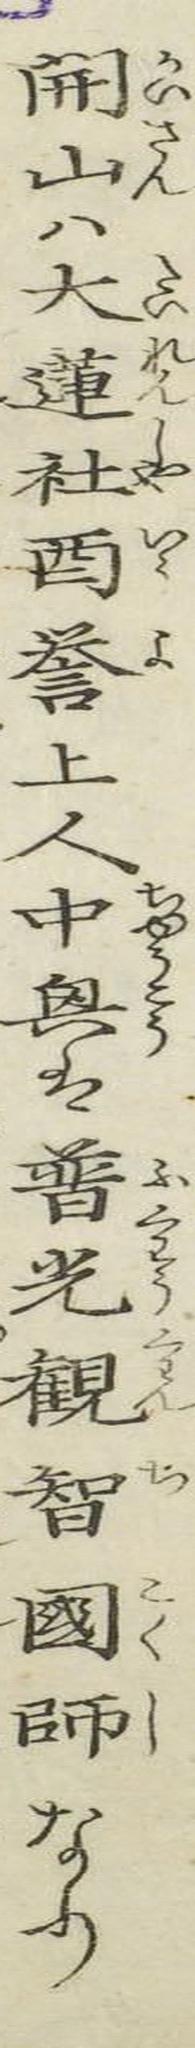開山は大蓮社酉誉上人中興は普光観智国師なり

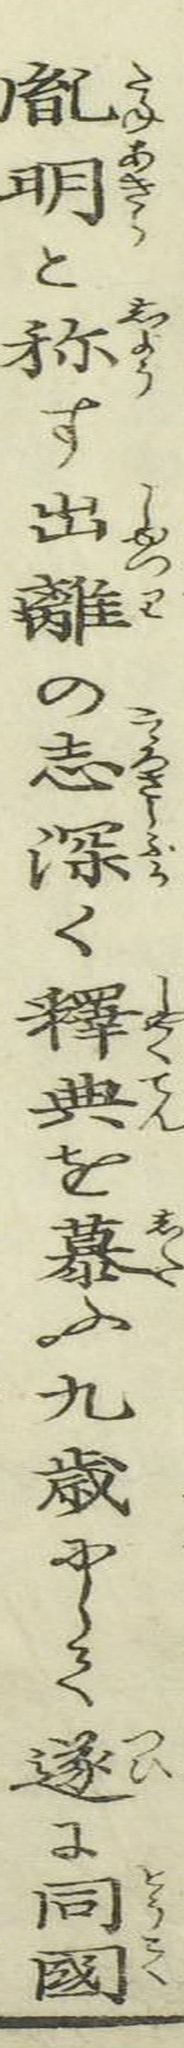胤明と称す出離の志深く釋典を慕ふ九歳にして遂に同國
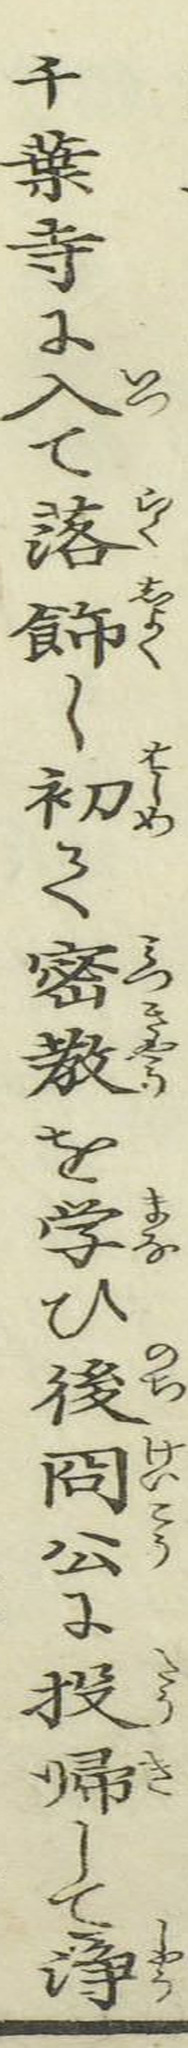千葉寺に入て落飾し初て密教を学ひ後冏公に投帰して浄
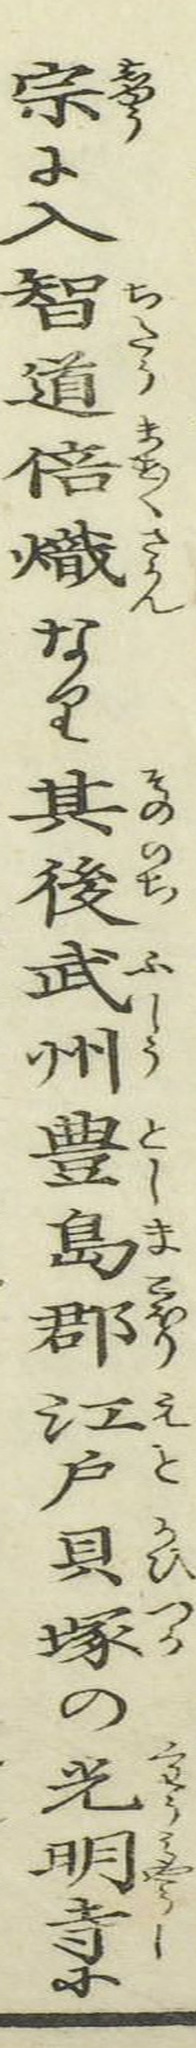宗に入智道倍熾なり其後武州豊島郡江戸貝塚の光明寺に
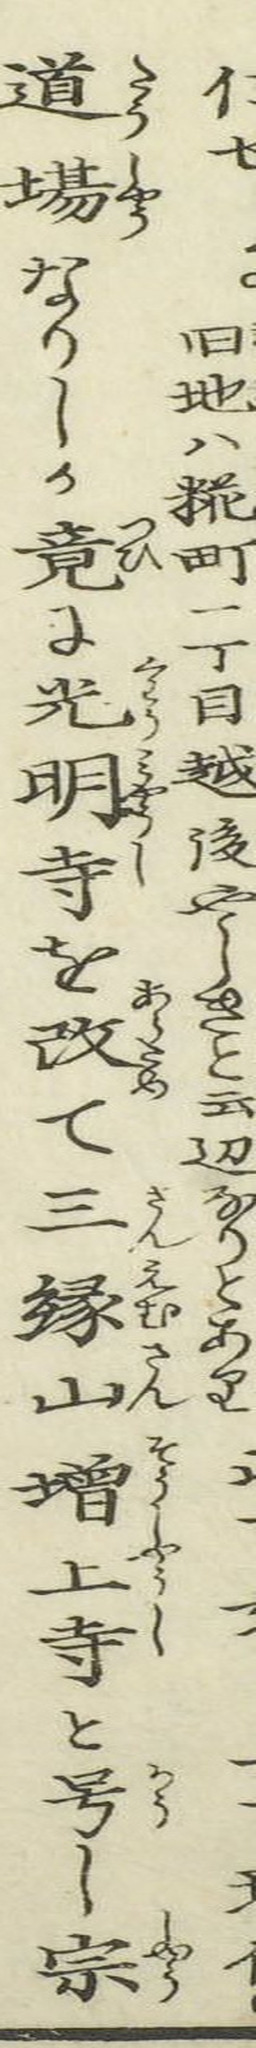道場なりしか竟に光明寺を改て三縁山増上寺と号し宗
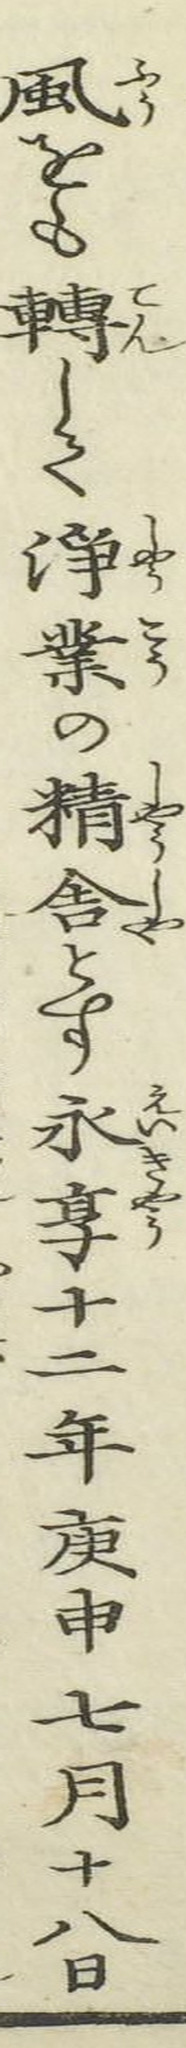風をも轉して浄業の精舎とす永享十二年庚申七月十八日
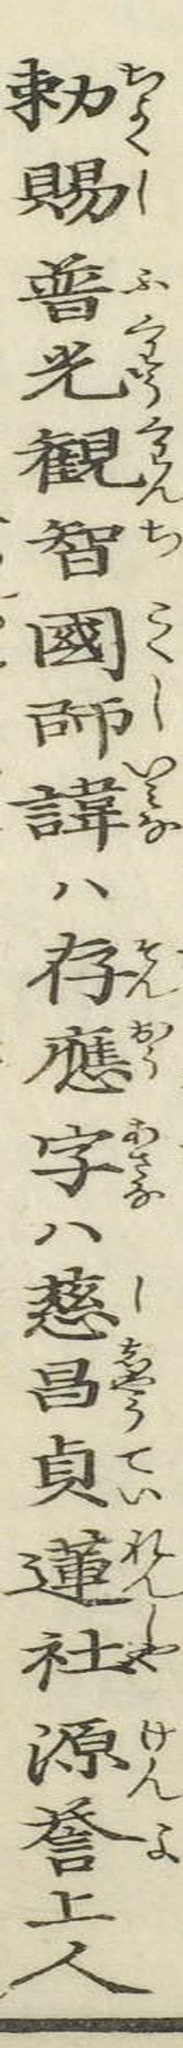勅賜普光観智國師諱は存應字は慈昌貞蓮社源誉上人
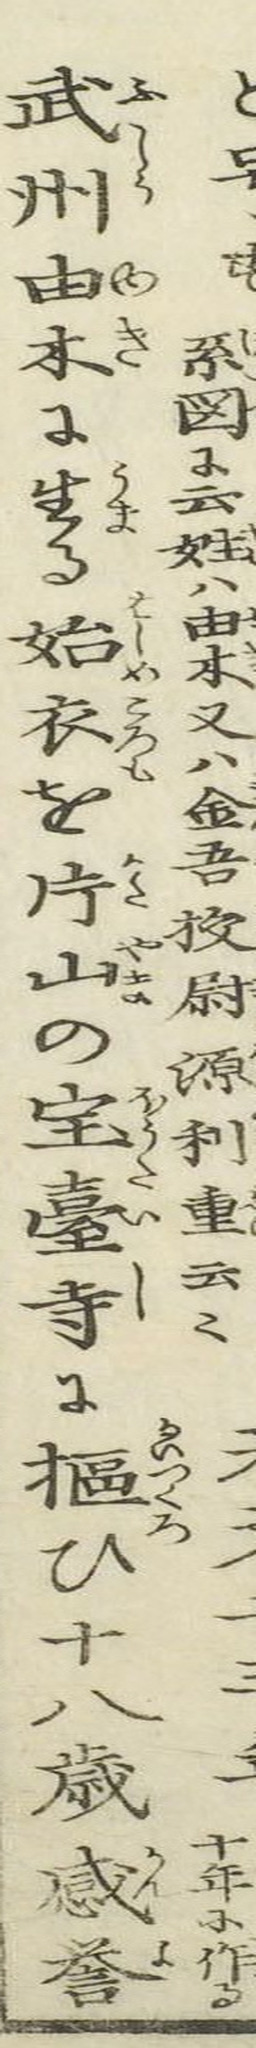武州由木に生る始衣を片山の宝臺寺に摳ひ十八歳感誉

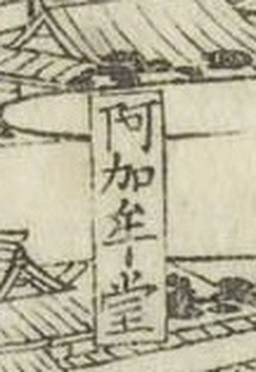阿加牟堂
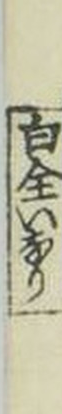白全いなり

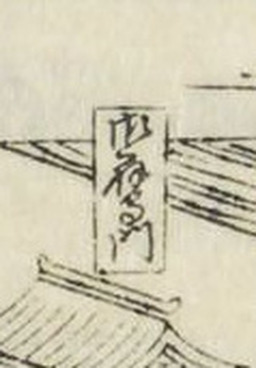御鷹門

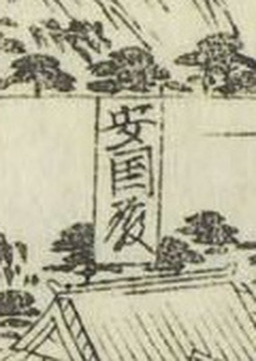安国殿
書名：江戸名所図会 20巻 巻之3
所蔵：東京学芸大学教育コンテンツアーカイブ
